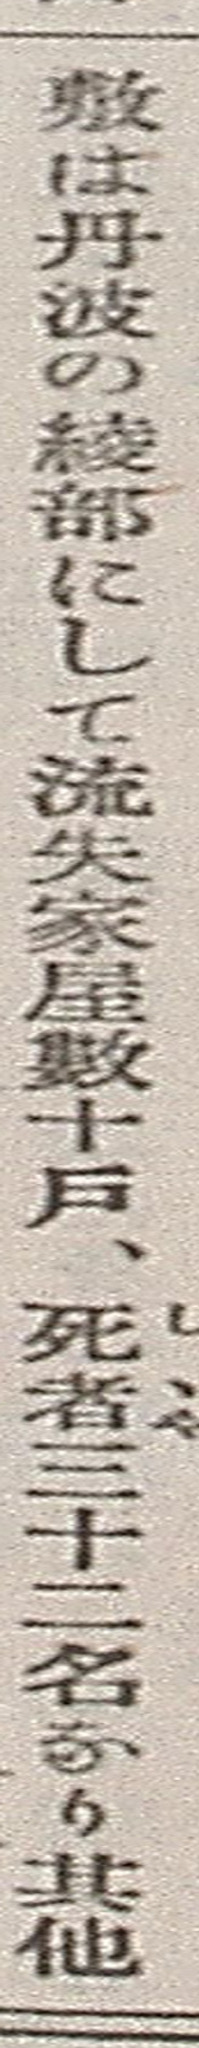敷は丹波の綾部にして流失家屋数十戸、死者三十二名なり其他
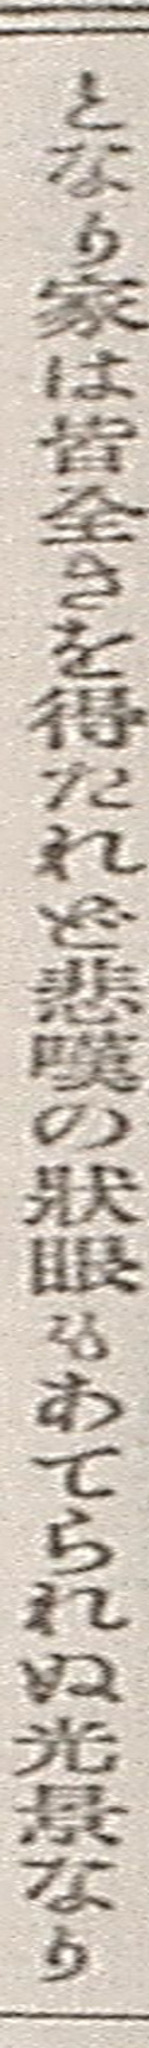となり家は全きを得たれど悲歎の状眼もあてられぬ光景なり
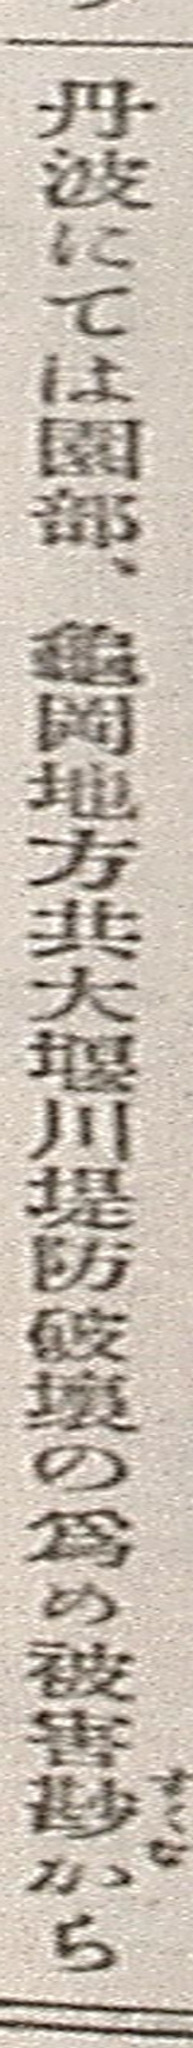丹波にては園部、亀岡地方共大堰川堤防破壊の為め被害尠から
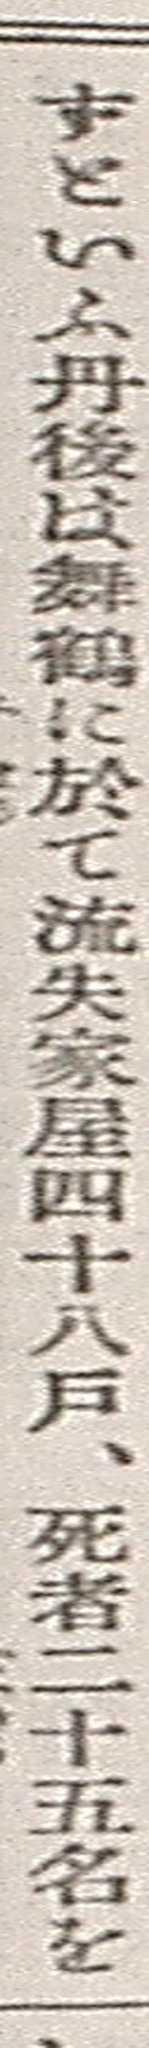ずといふ丹後は舞鶴に於て流失家屋四十八戸、死者二十五名を
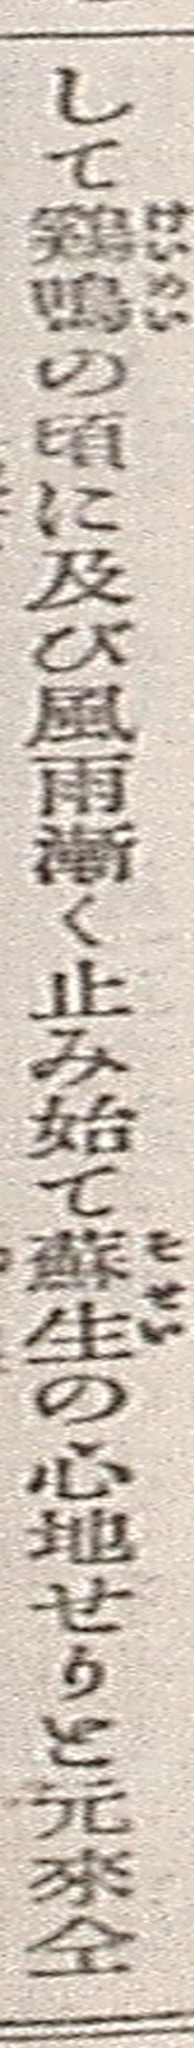して鶏鳴の頃に及び風雨漸く止み始て蘇生の心地せりと元来同
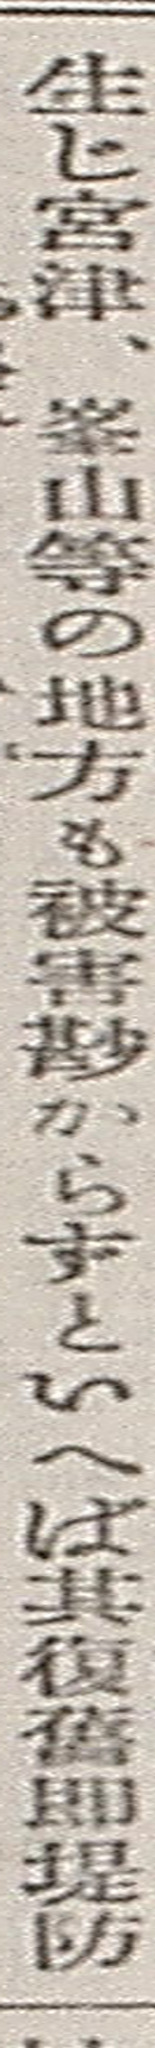生じ宮津、峯山等の地方も被害尠からずといへば其復舊即堤防
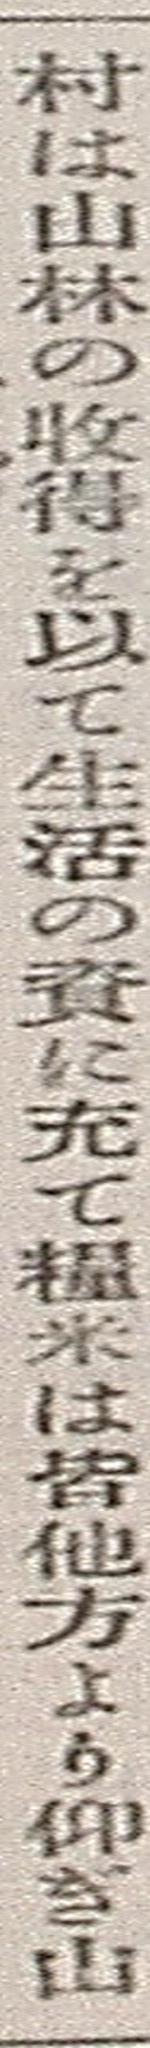村は山林の収得を以て生活の資に充て糧米は皆他方より仰ぎ山
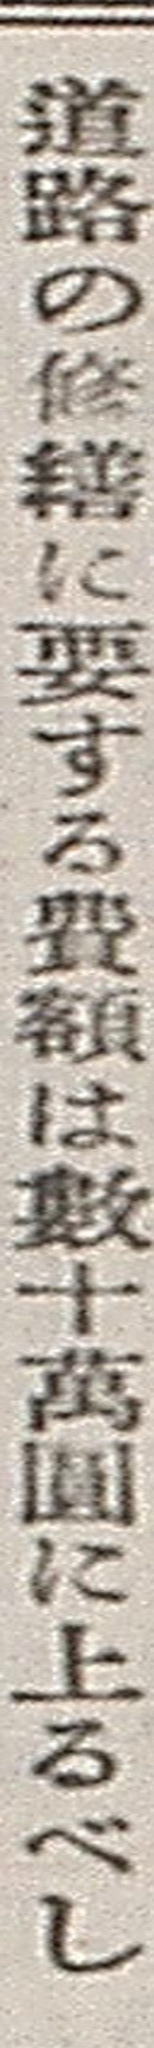道路の修繕に要する費額は数十万円に上るべし
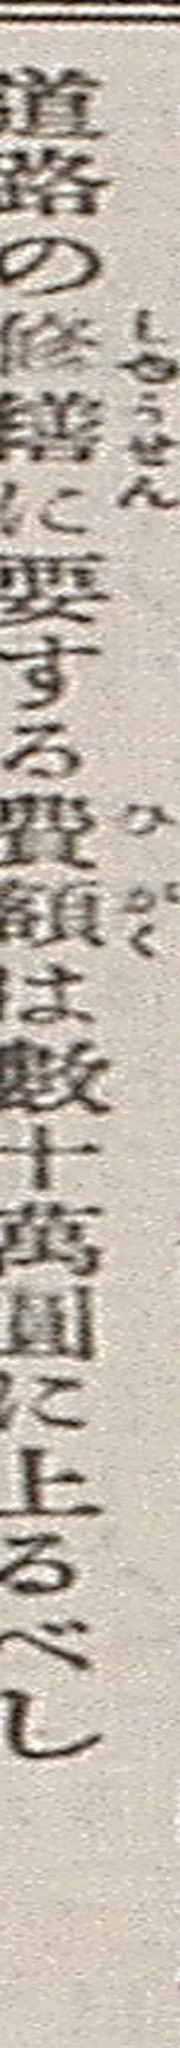道路の修繕に要する費額は数十万円に上るべし
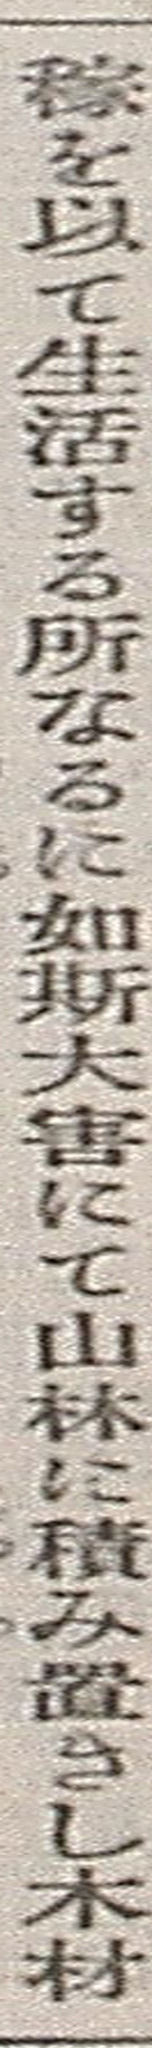稼を以て生活する所なるに如斯大害にて山林に積み置きし木材
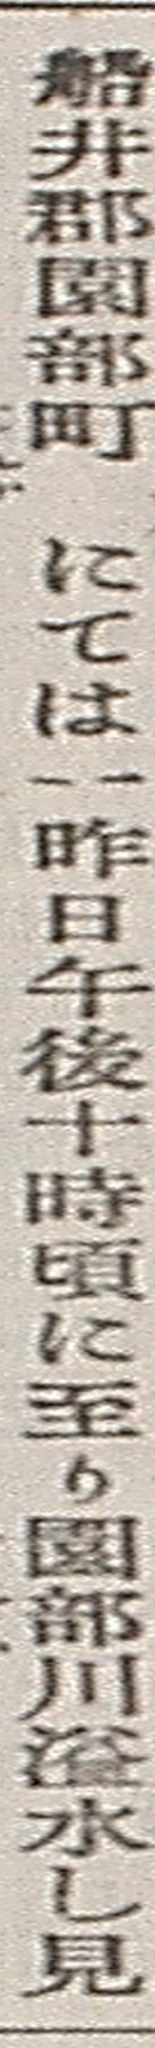船井郡園部町にては一昨日午後十時頃に至り園部川溢水し見
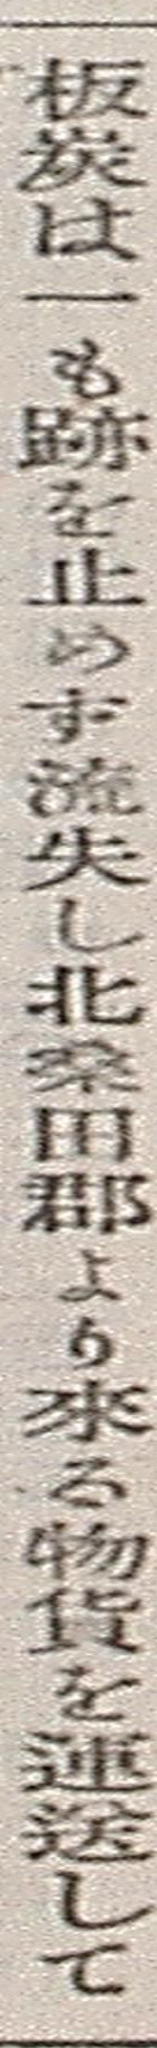板炭は一も跡を止めず流失し北桑田郡より来る物貨を運送して
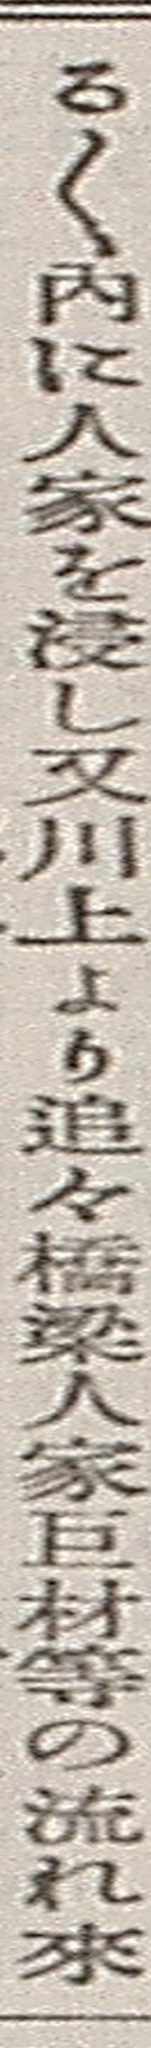る〳〵内に人家を浸し又川上より追々橋梁人家巨材等の流れ来
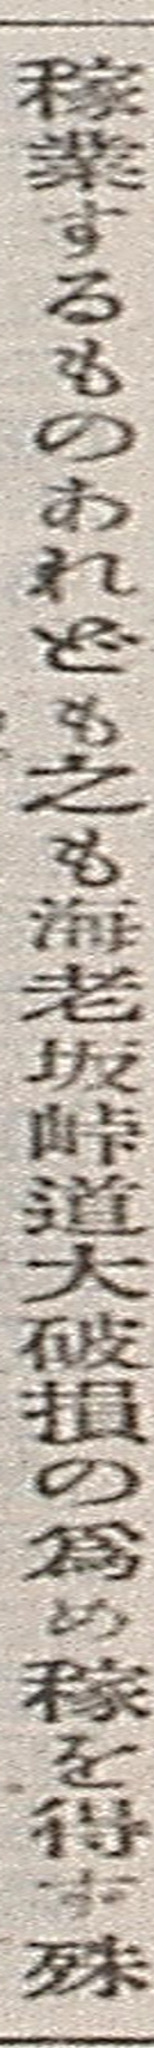稼業するものあれども之も海老坂峠道大破損の為め稼を得ず殊
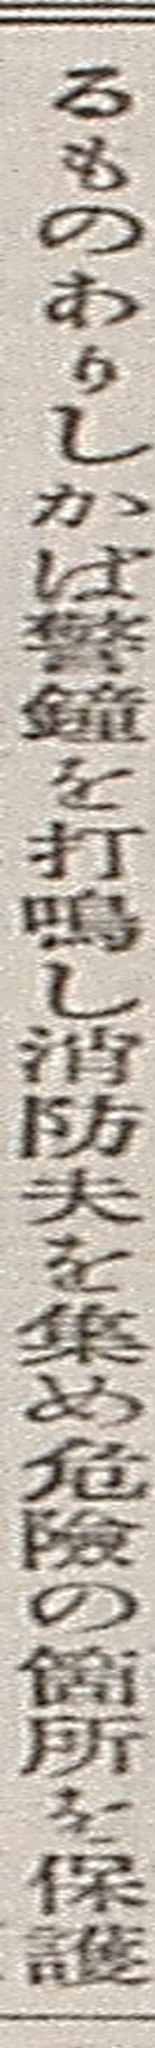るものありしかば警鐘をを打鳴し消防夫を集め危険の箇所を保護
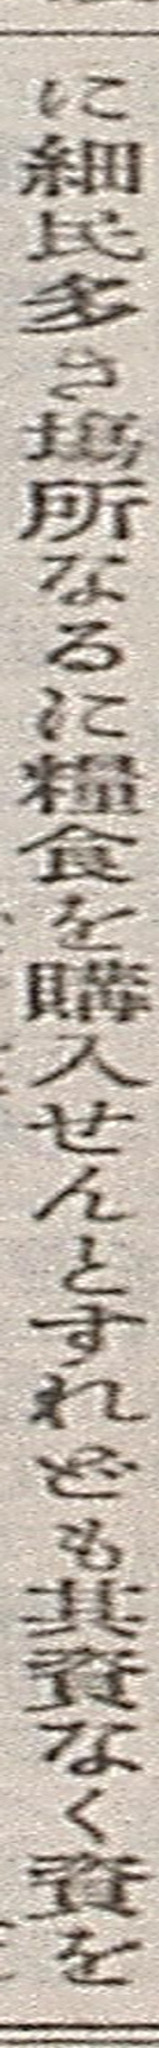に細民多き場所なるに糧食を購入せんとすれども其資なく資を
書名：風俗畫報臨時増刊第百二十六號　洪水被害録（中）
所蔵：東京大学地震研究所図書室 Earthquake Research Institute Library, The University of Tokyo, JAPAN
